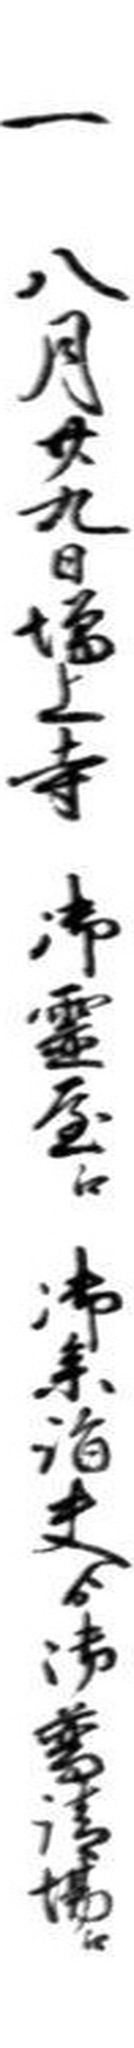一八月廿九日増上寺御霊屋江御参詣夫ゟ御普請場江
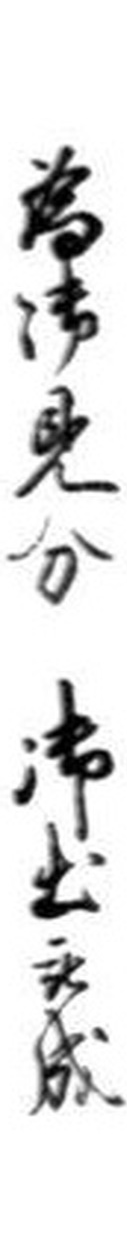為御見分御出被成
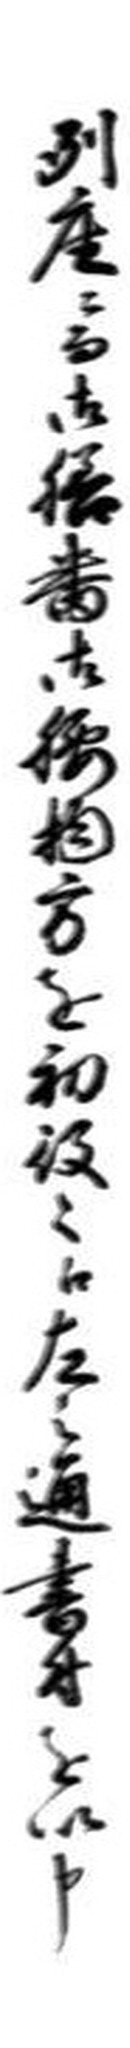列座ニ而御膳番御腰物方を初役々江左之通書付を以申
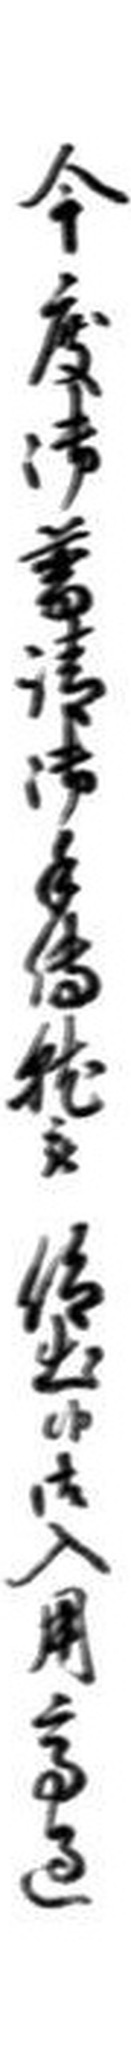今度御普請御手伝就被仰出候御入用高過
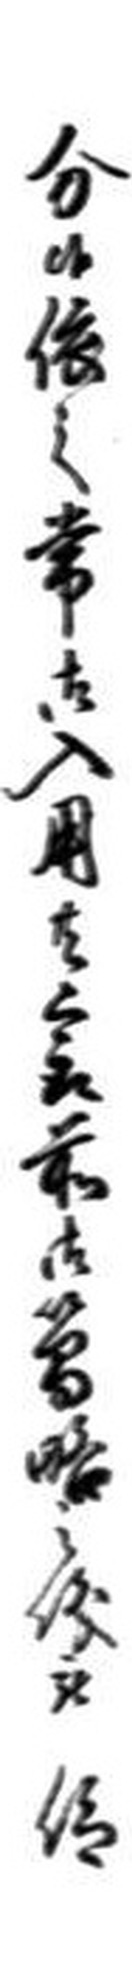分候依之常御入用共最前御簡略之儀被仰
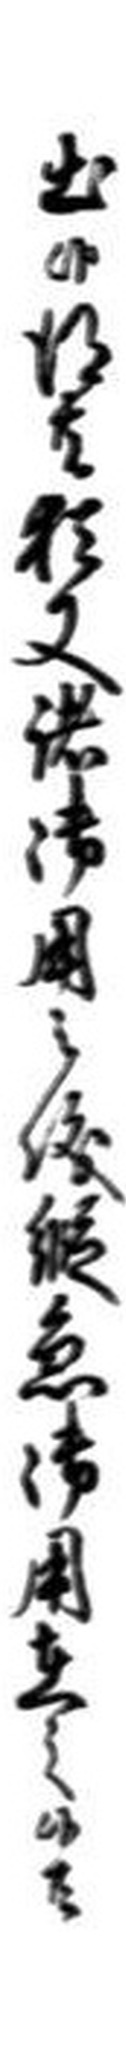出候得共猶又諸御用之儀縦急御用在之候共
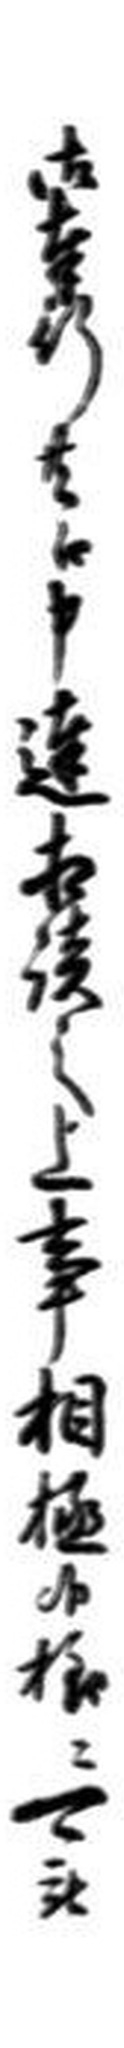御奉行共江申達相談之上事相極候様ニ可被
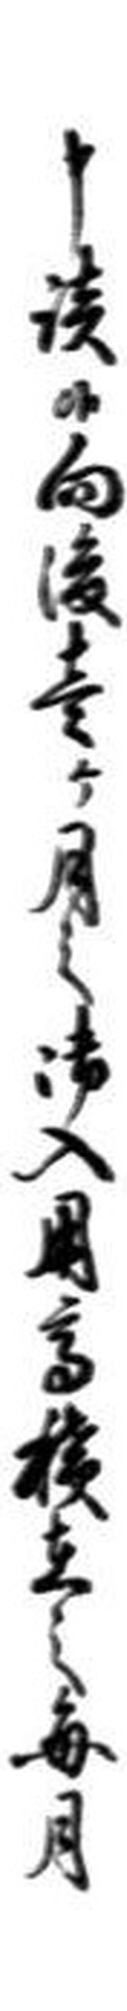申談候向後壱ヶ月之御入用高積在之毎月
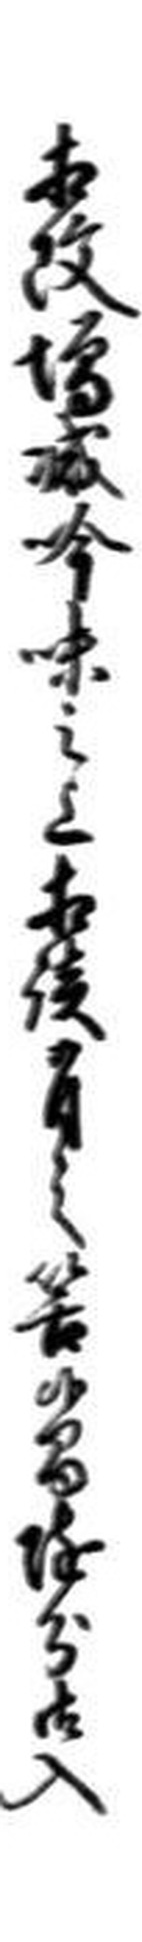相改増減吟味之上相談有之筈候間随分御入

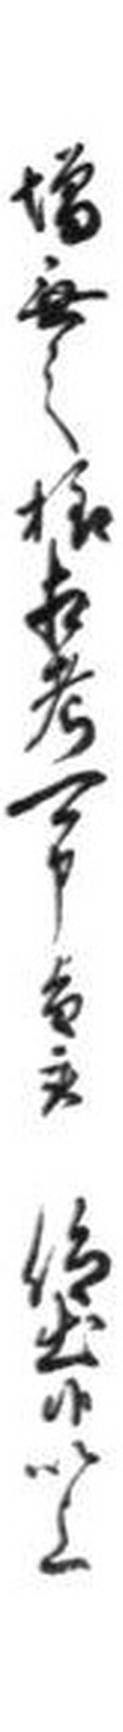増無之様相考可申旨被仰出候以上
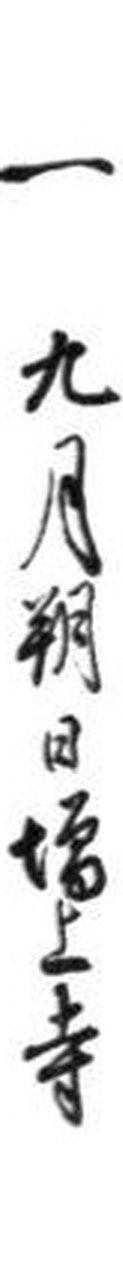一九月朔日増上寺
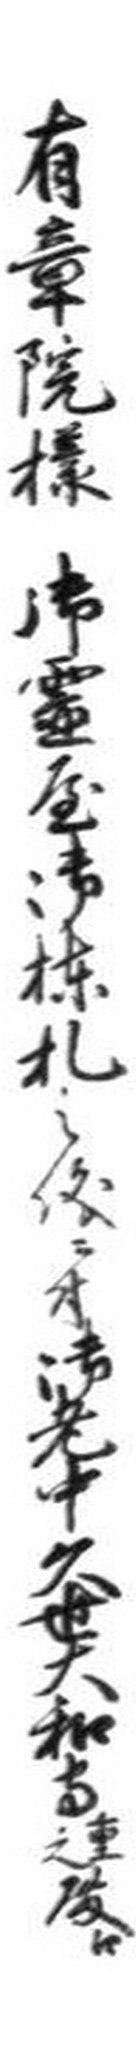有章院様御霊屋御棟札之儀ニ付御老中久世大和守重之殿江
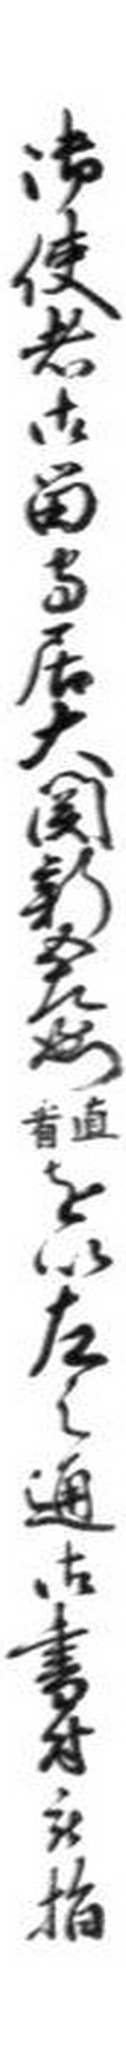御使者御留守居大関新五左衛門直看を以左之通御書付被指
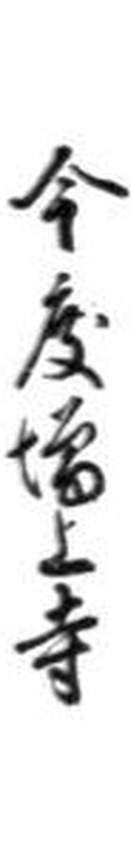今度増上寺
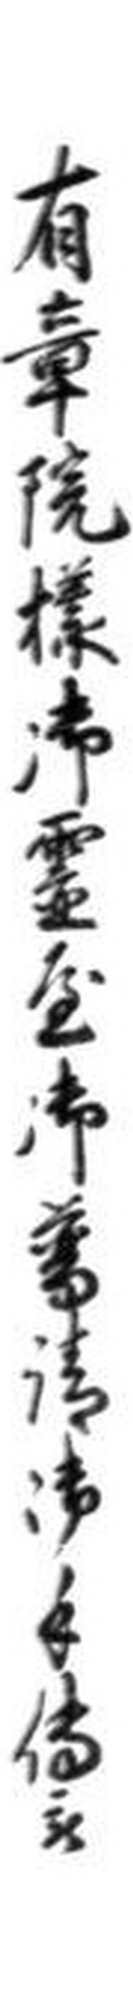有章院様御霊屋御普請御手伝被
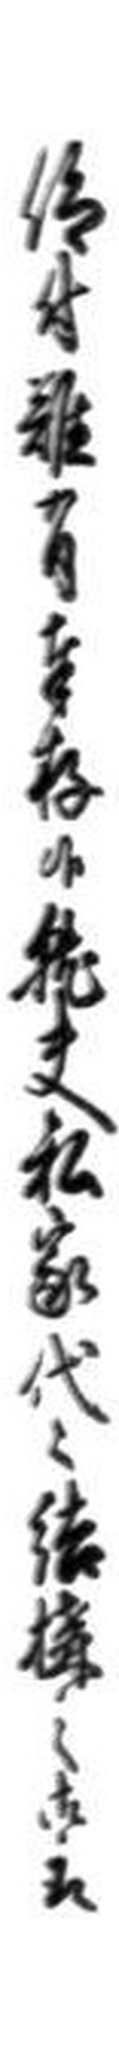仰付難有奉存候就夫私家代々結構之御取
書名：家譜 三十一 吉邦公 享保元年
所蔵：福井県文書館 Fukui Prefectural Archives
